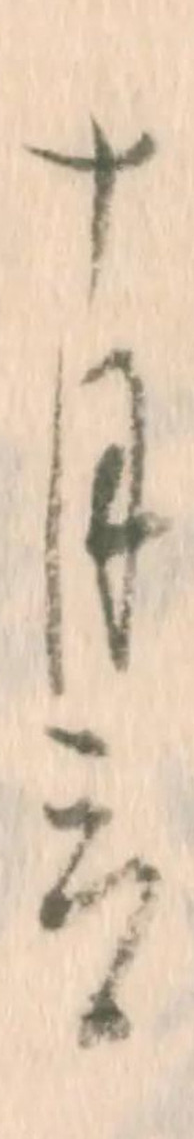十月三日
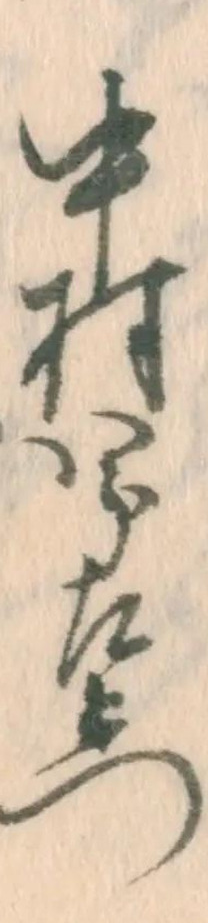中村八郎左衛門
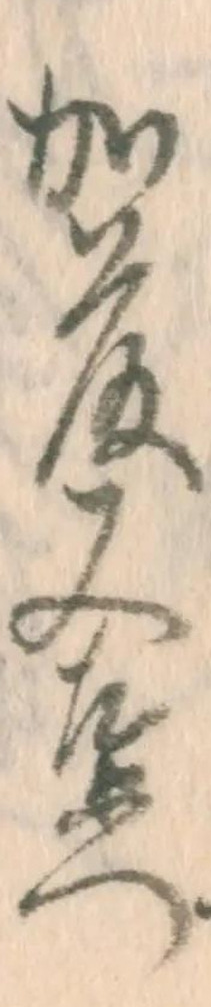加藤又左衛門
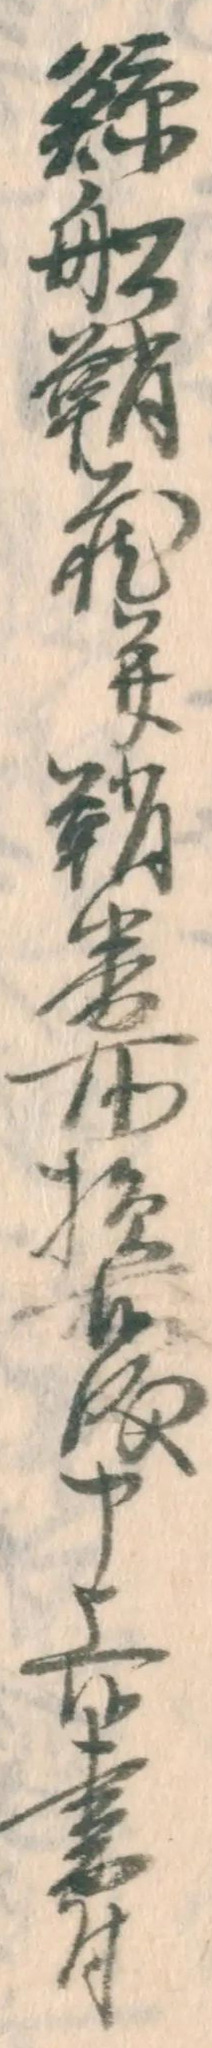│鯨船鞘蔵幷鞘番所損候儀申上候書付

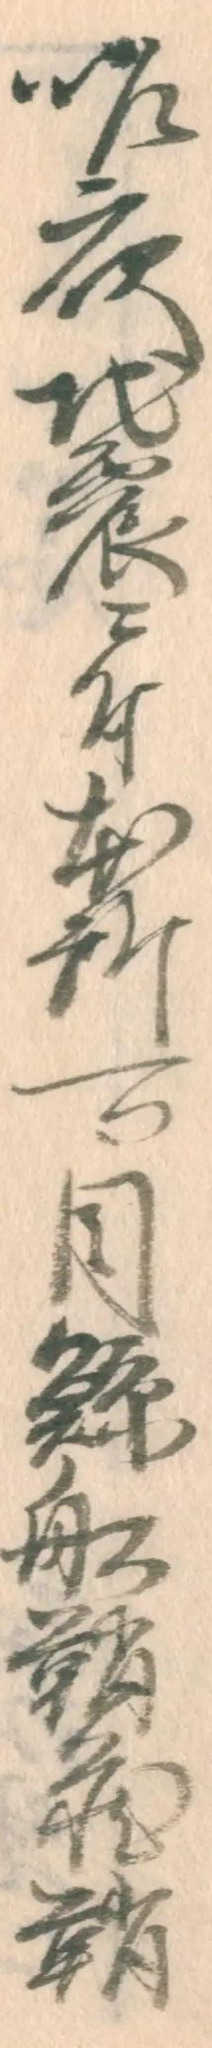昨夜地震ニ付本所一ツ目鯨船鞘蔵鞘
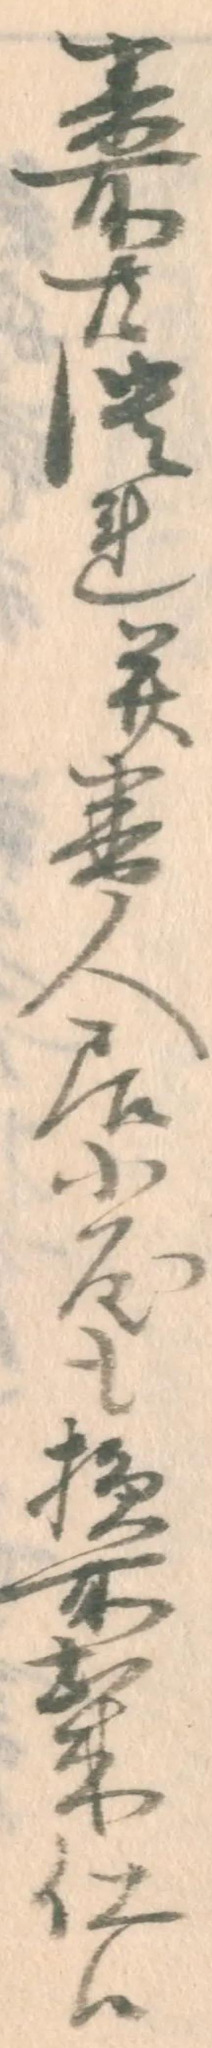番所共潰れ幷番人居小屋も損所出来仕候
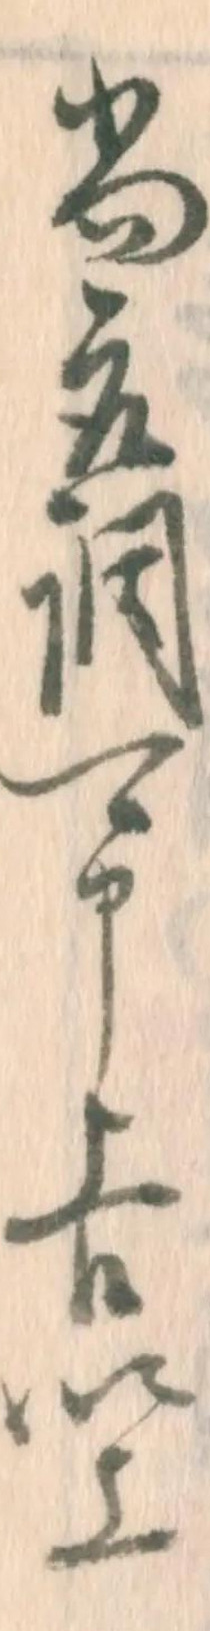尚取調可申上候以上
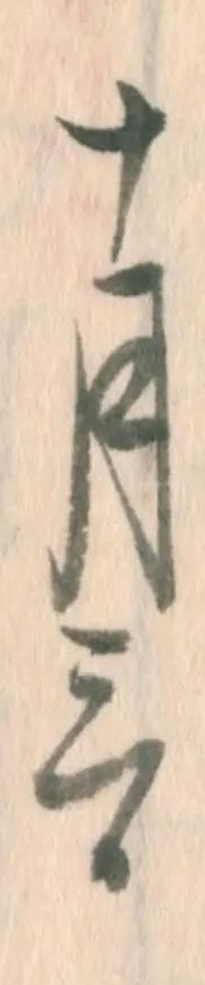十月三日
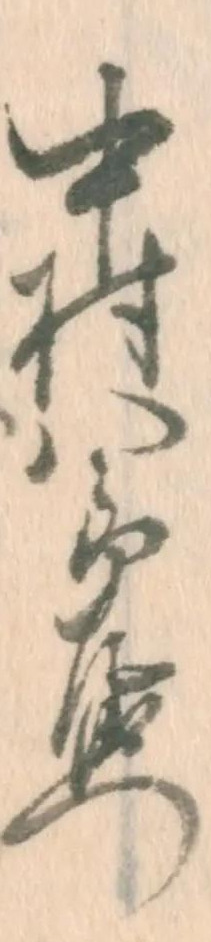中村八郎左衛門
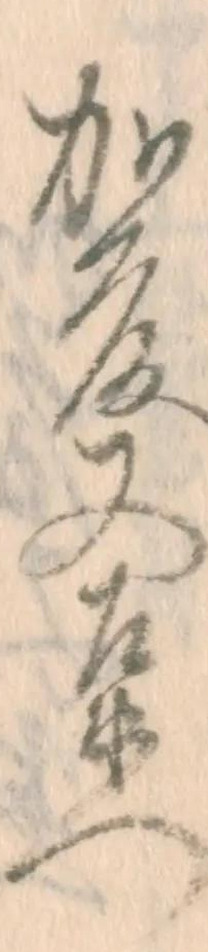加藤又左衛門
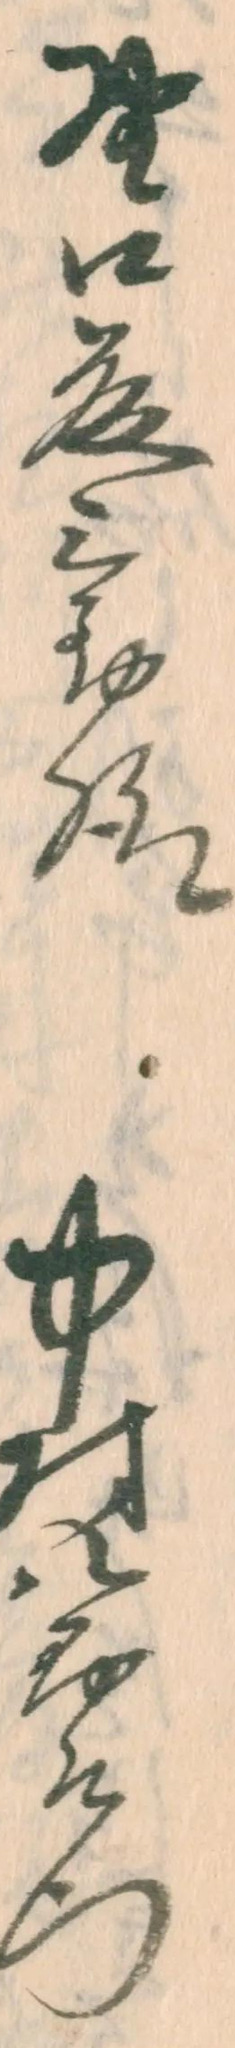│野口藤三郎様中村八郎左衛門
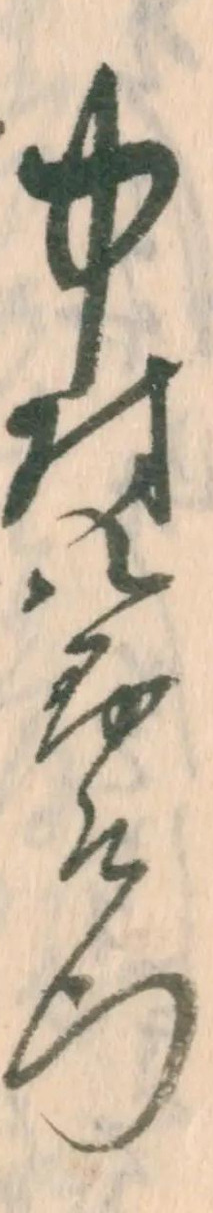中村八郎左衛門
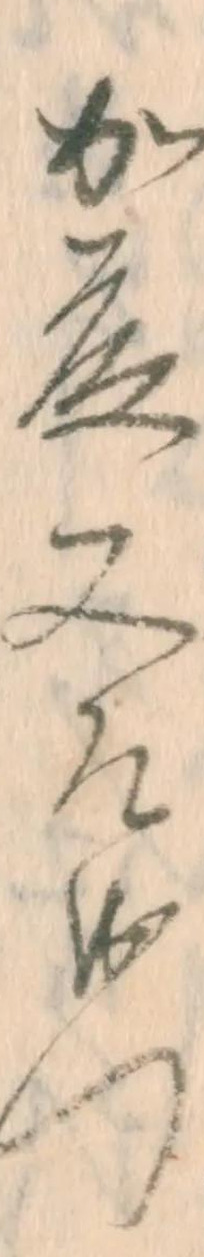加藤又左衛門
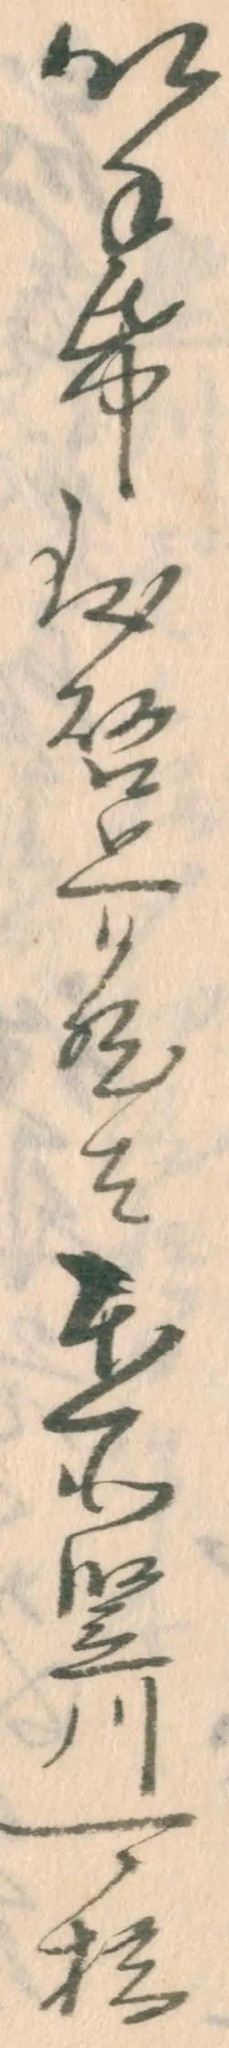以手紙致啓上候然は本所竪川一ノ橋
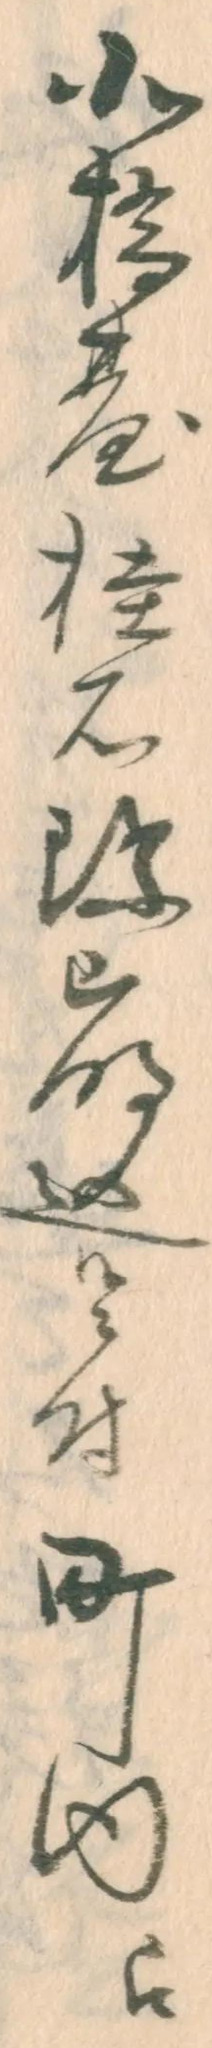北橋台柱石際崩込候ニ付町内え

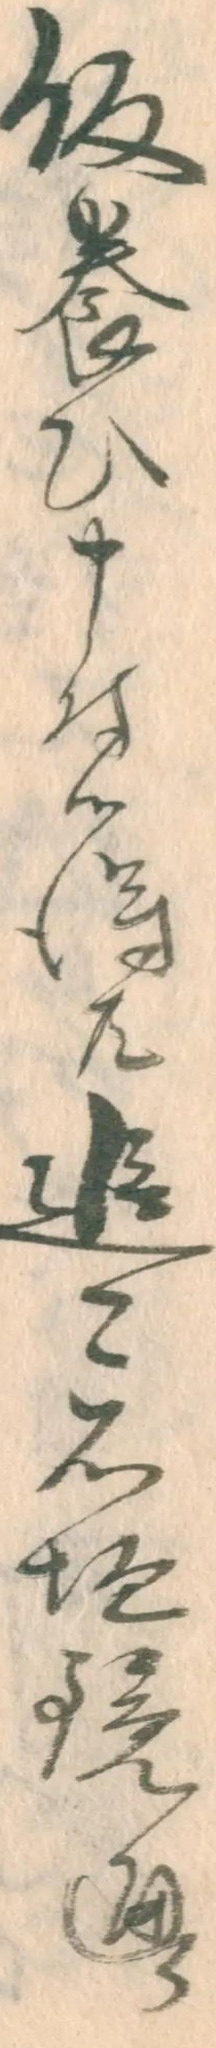仮養ひ申付候得共追々石垣鏡通リ
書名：地震災書留 2巻. [1] 内表紙に「地震災書留　安政二卯年　但本所深川御用屋敷地代免除調」とあり
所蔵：国立国会図書館 National Diet Library, JAPAN
